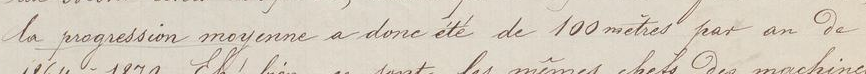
la progression moyenne a donc été de 100 mètres par an de
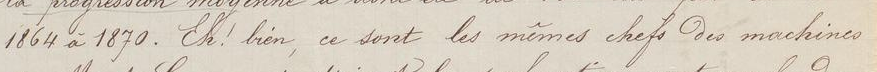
1864 à 1870. Eh! bien, ce sont les mêmes chefs des machines
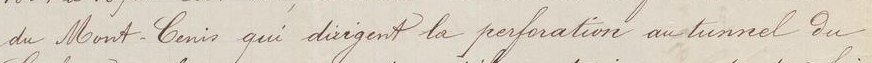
du Mont-Cenis qui dirigent la perforation au tunnel du
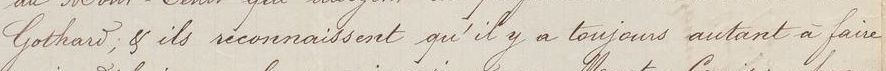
Gothard; & ils reconnaissent qu'il y a toujours autant à faire
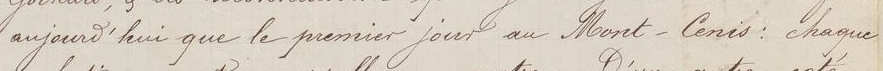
aujourd'hui que le premier jour au Mont-Cenis: chaque
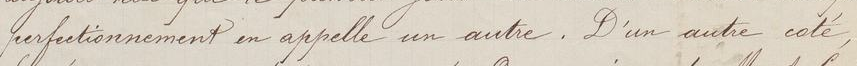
perfectionnement en appelle un autre. D'un autre coté,
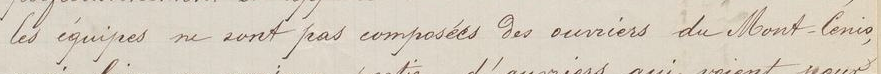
les équipes ne sont pas composées des ouvriers du Mont-Cenis,
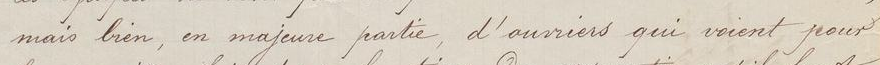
mais bien, en majeure partie, d'ouvriers qui voient pour
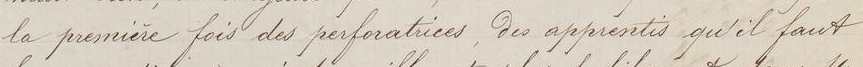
la première fois des perforatrices, des apprentis qu'il faut
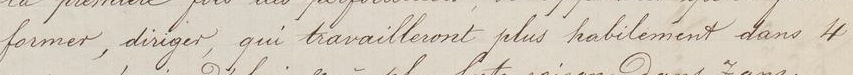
former, diriger, qui travaillent plus habilement dans 4
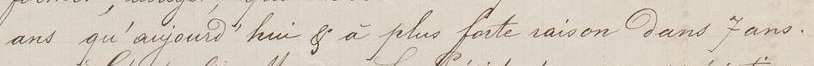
ans qu'aujourd'hui & à plus forte raison dans 7 ans.
